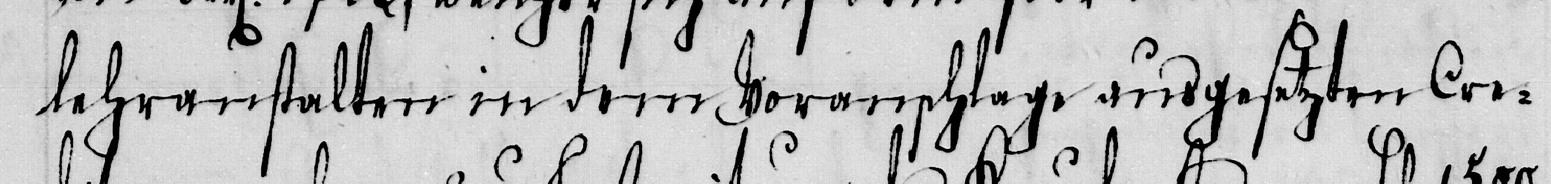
lehranstalten in dem Voranschlage ausgesetzten Cre¬
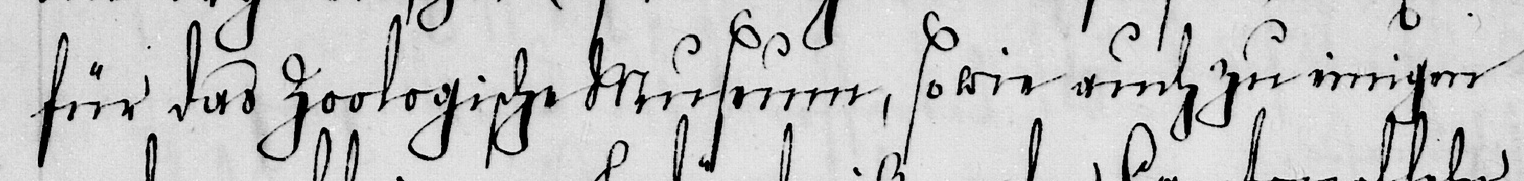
für das Zoologische Museum, sowie auch zu einigen
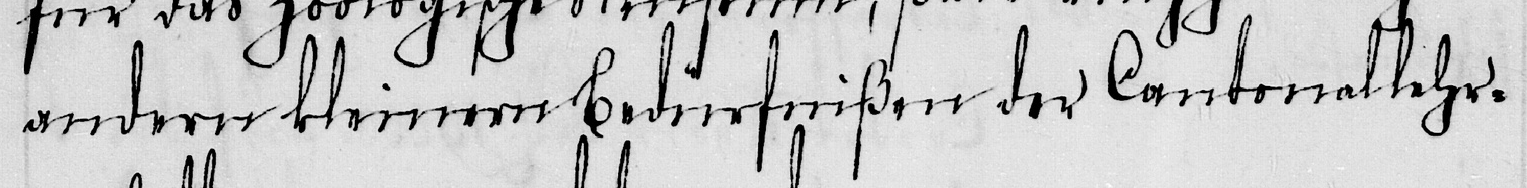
andern kleinern Bedürfnißen der Cantonallehr¬
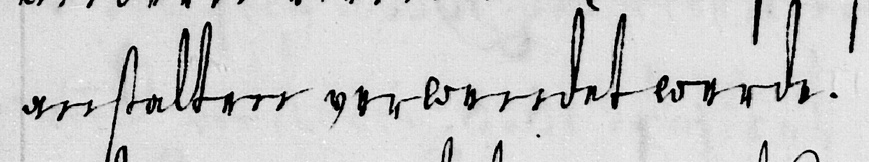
anstalten verwendet werde.
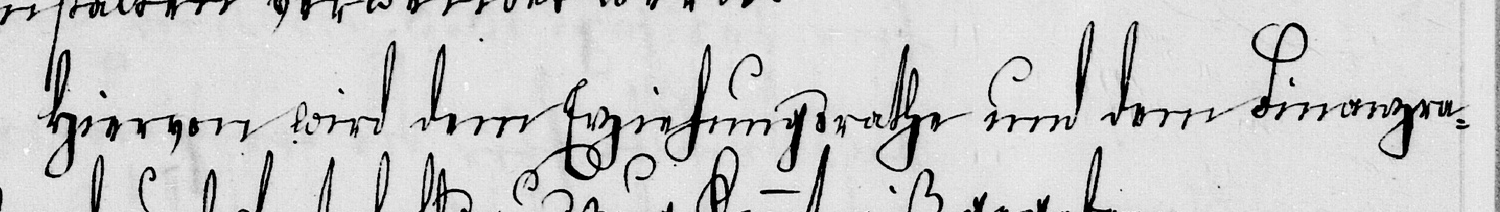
Hiervon wird dem Erziehungsrathe und dem Finanzra¬
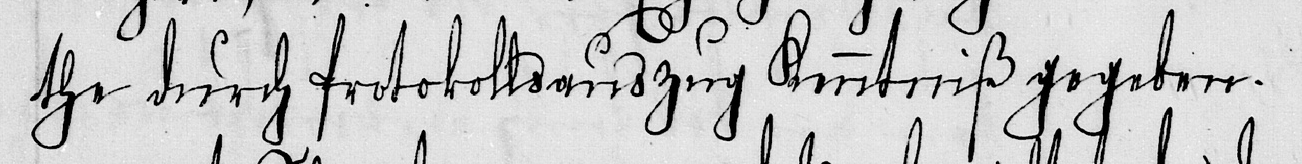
the durch Protokollsauszug Kenntniß gegeben.
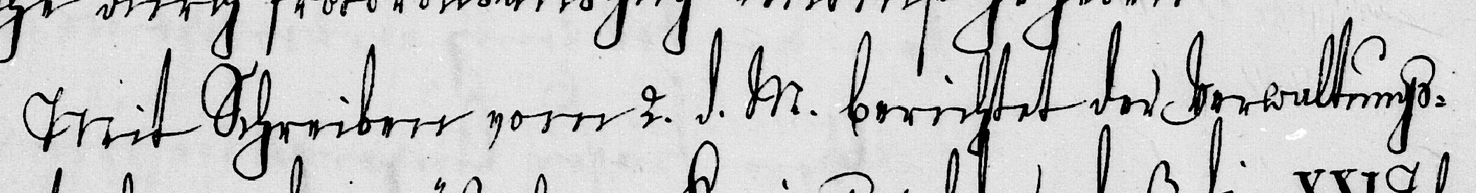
Mit Schreiben vom 2. d. M. berichtet der Verwaltungsr¬
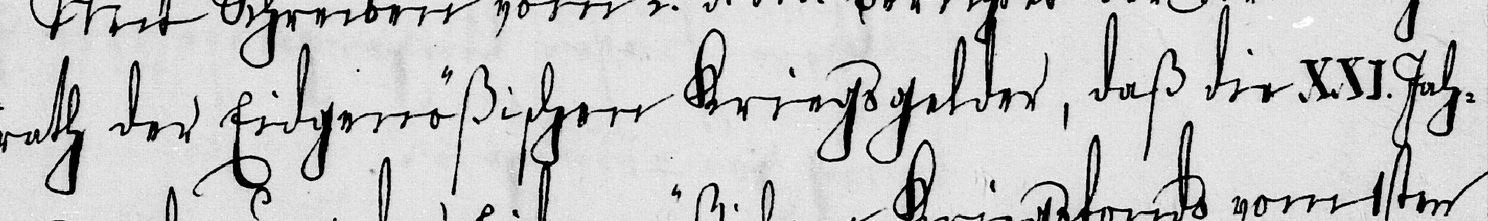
ath der Eidgenößischen Kriegsgelder, daß die XXI. Jah¬
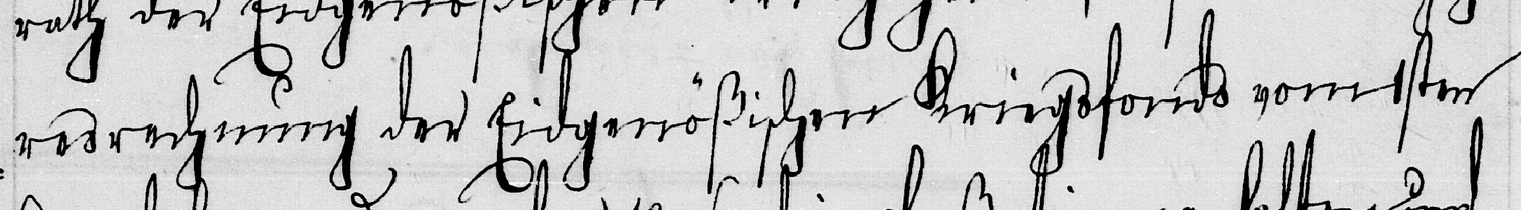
resrechnung der Eigenößischen Kriegsfonds vom 1sten
